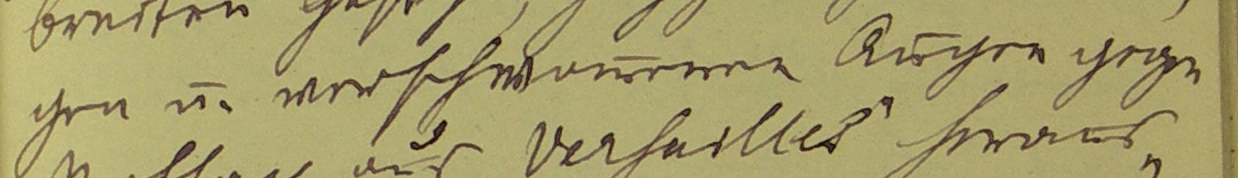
gen u. verschwommenen Augen gegen
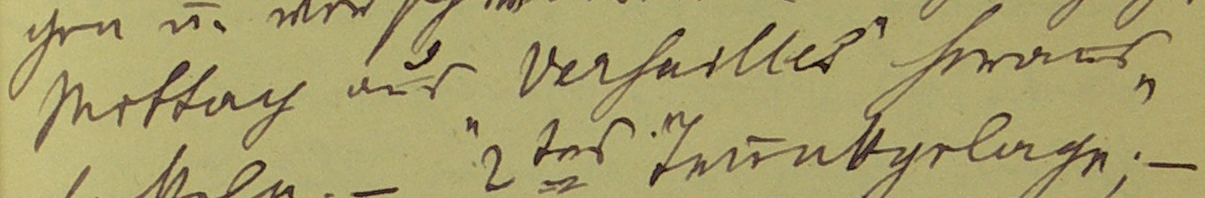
Mittag aus „ ??? “ heraus¬
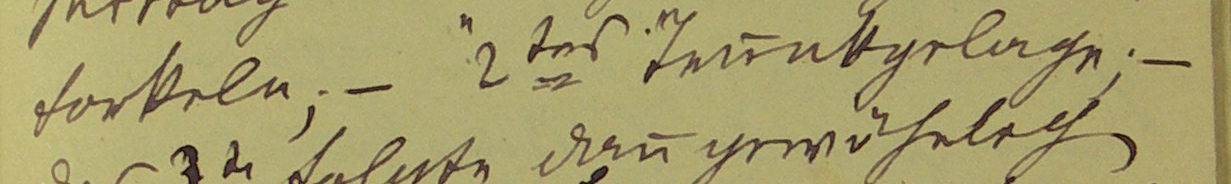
torkeln;-- „2-tes“ Trinkgelage; --
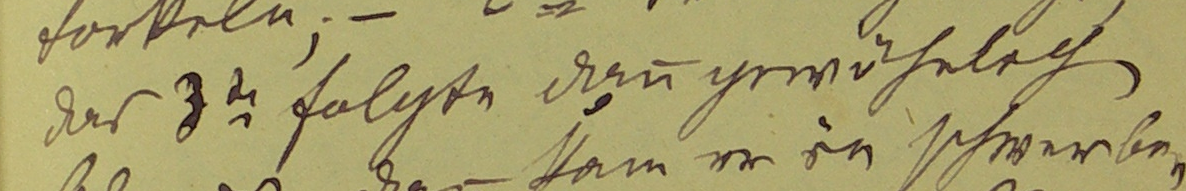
das 3-te folgte dann gewöhnlich
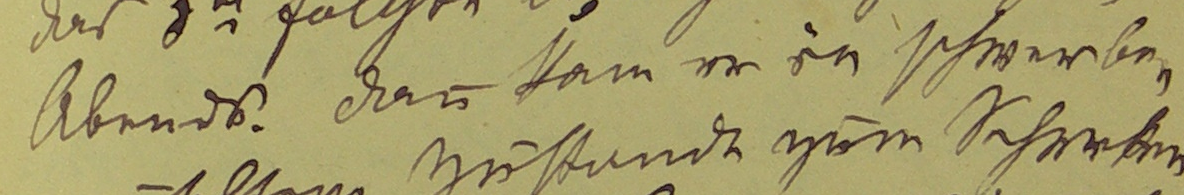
Abends. Dann kam er in schwerbe¬
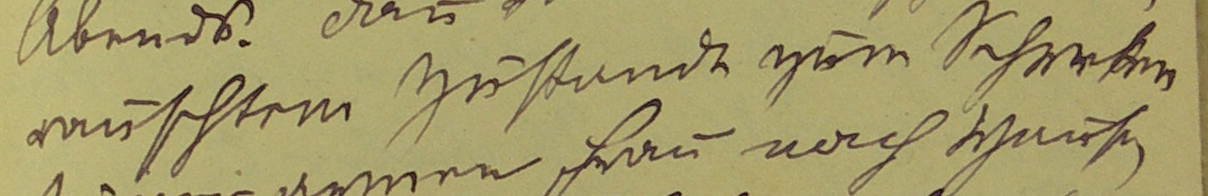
rauschtem Zustande zum Schrecken
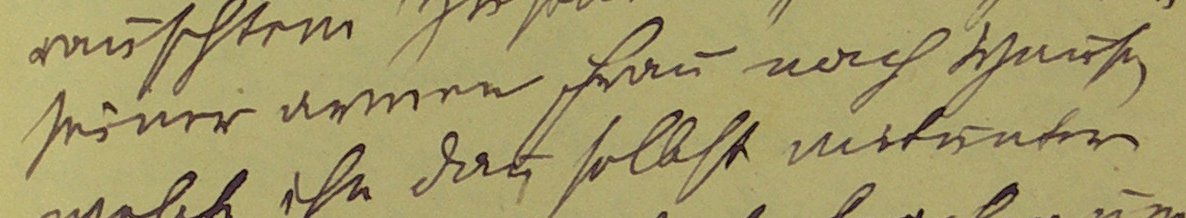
seiner armen Frau nach Hause,
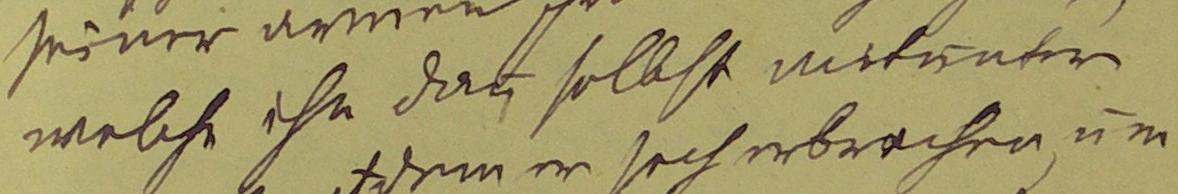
welche ihn dann selbst mitunter
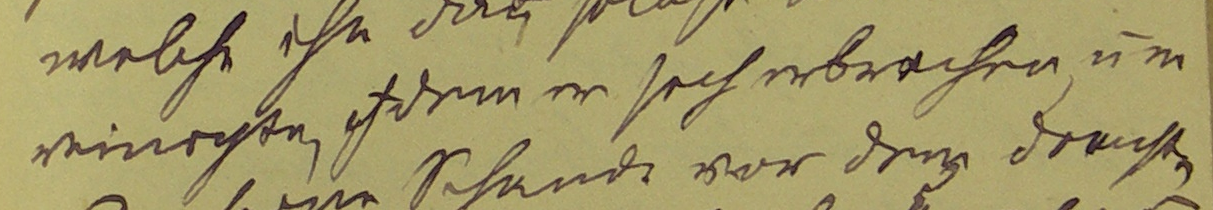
reinigte, chdem er sich erbrochen, um
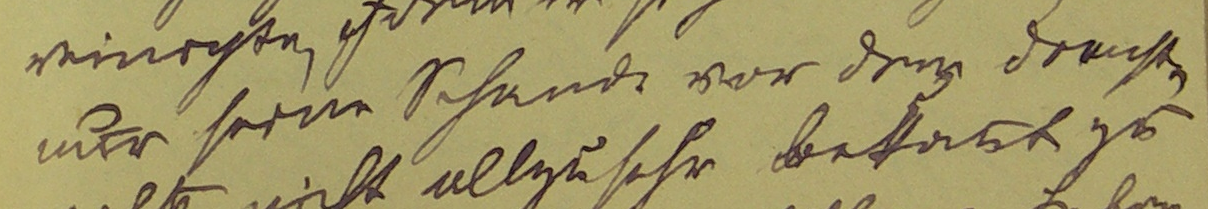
nur seine Schande vor dem Dienst¬
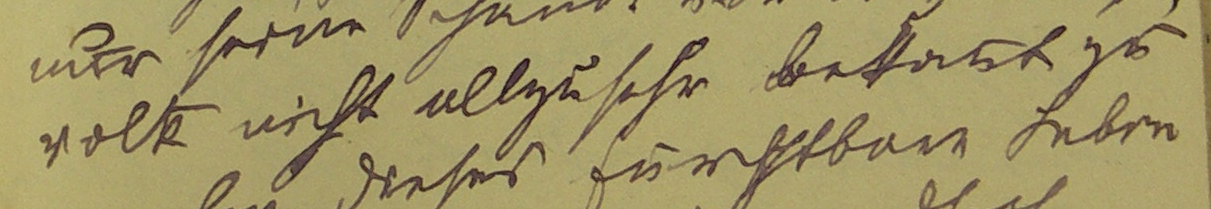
volk nicht allzusehr bekannt zu
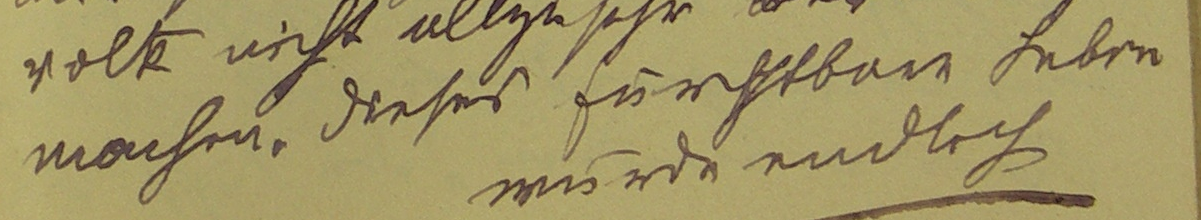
machen. Dieses furchtbare Leben
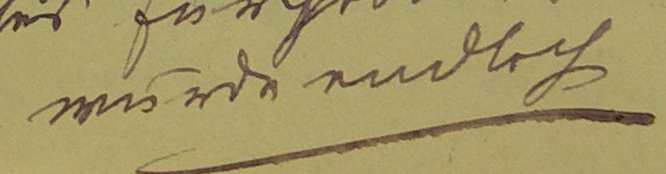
wurde endlich.
